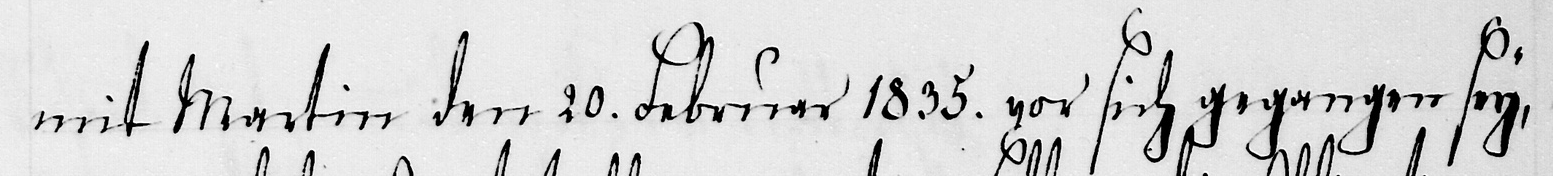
mit Martin den 20. Februar 1835. vor sich gegangen sey,
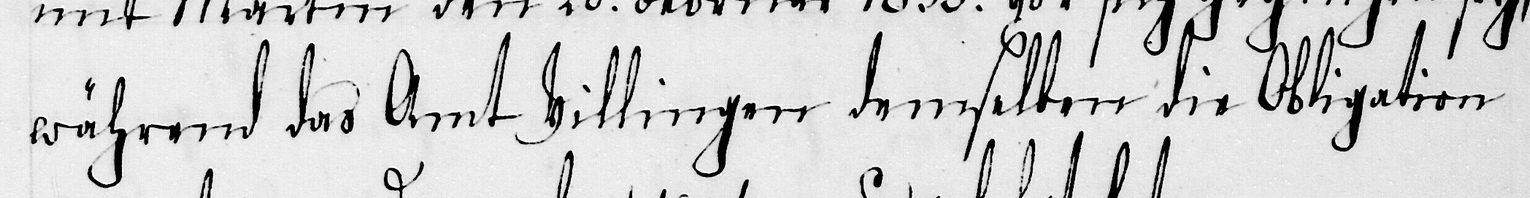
während das Amt Villingen demselben die Obligation
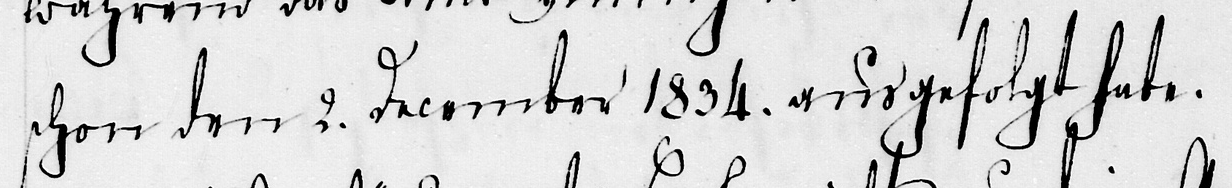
schon den 2. December 1834. ausgefolgt habe.
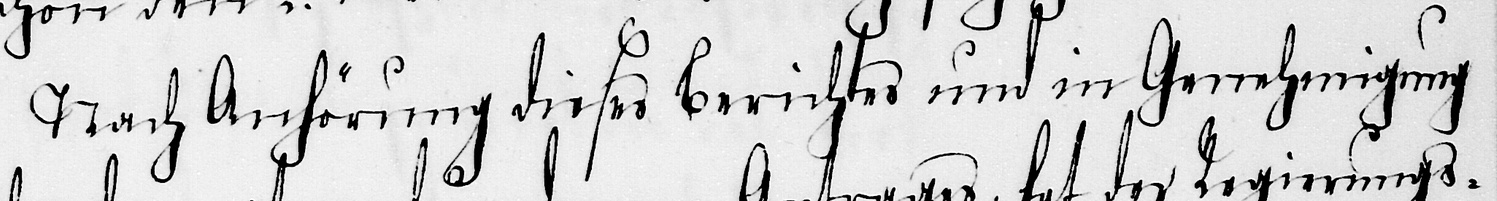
Nach Anhörung dieses Berichtes und in Genehmigung
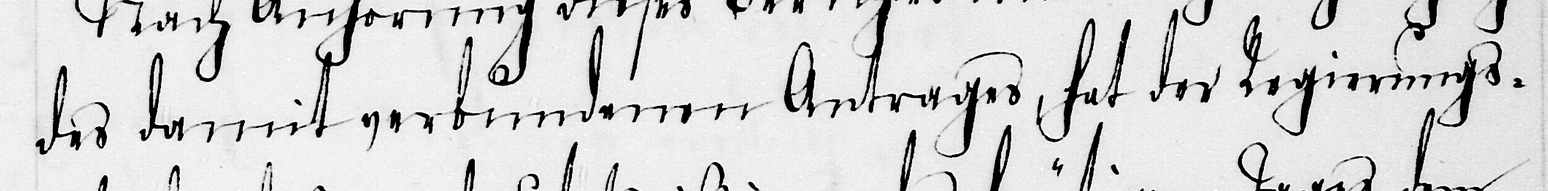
des damit verbundenen Antrages, hat der Regierungs¬
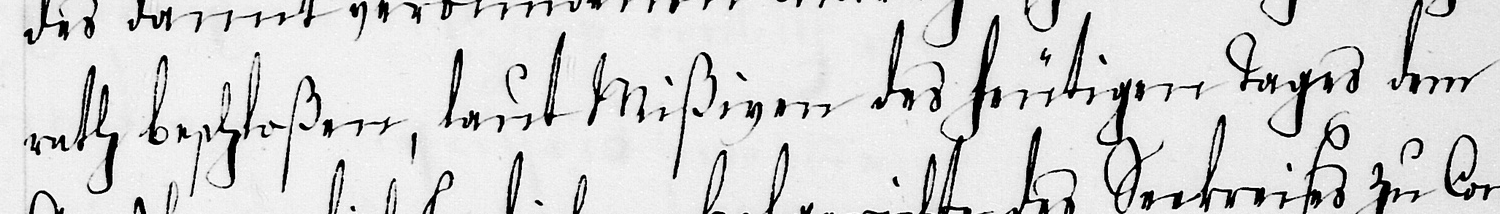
rath beschloßen, laut Mißiven des heutigen Tages dem
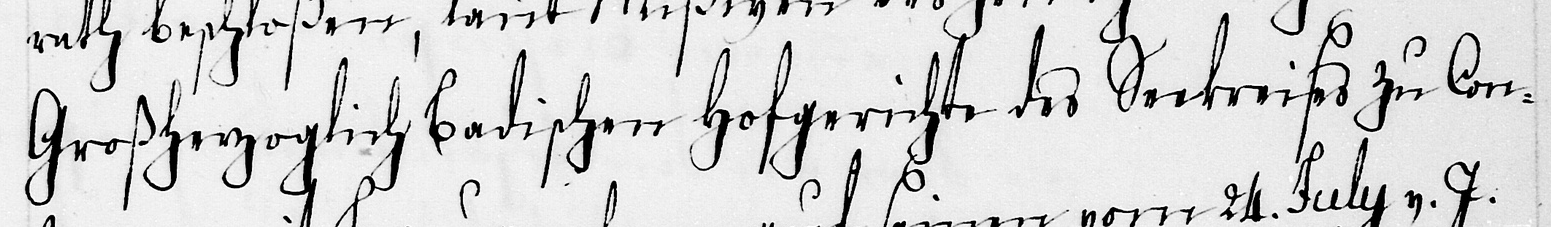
Großherzoglich Badischen Hofgerichte des Seekreises zu Co¬
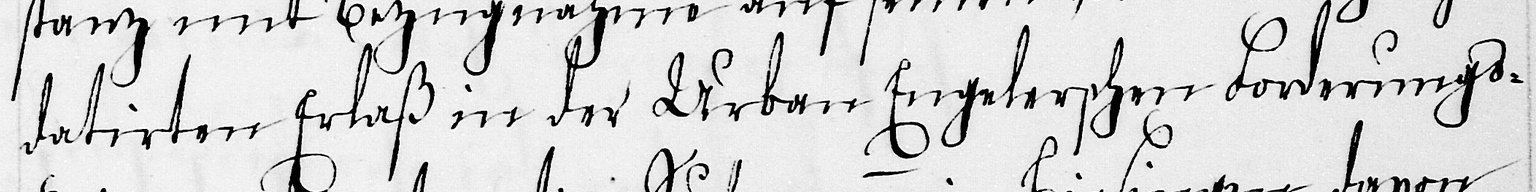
datirten Erlaß in der Urban Engelerschen Forderungs¬
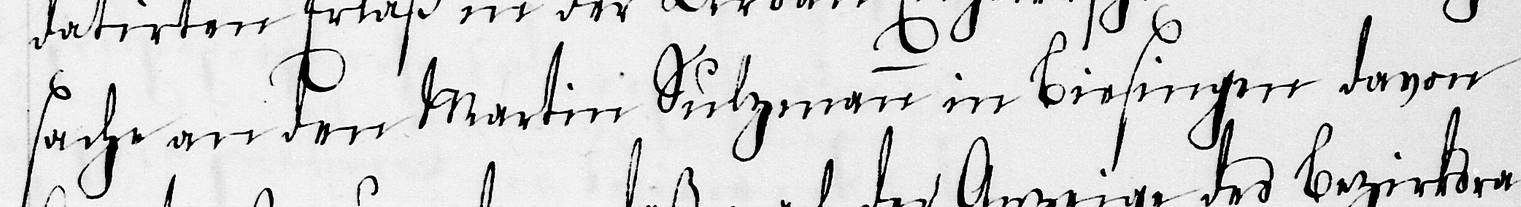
sache an den Martin Sulzmann in Biesingen davon
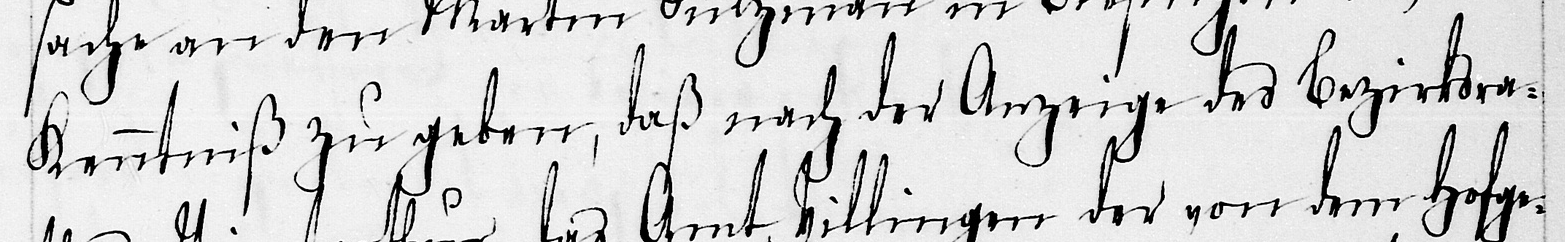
Kenntniß zu geben, daß nach der Anzeige des Bezirksra¬
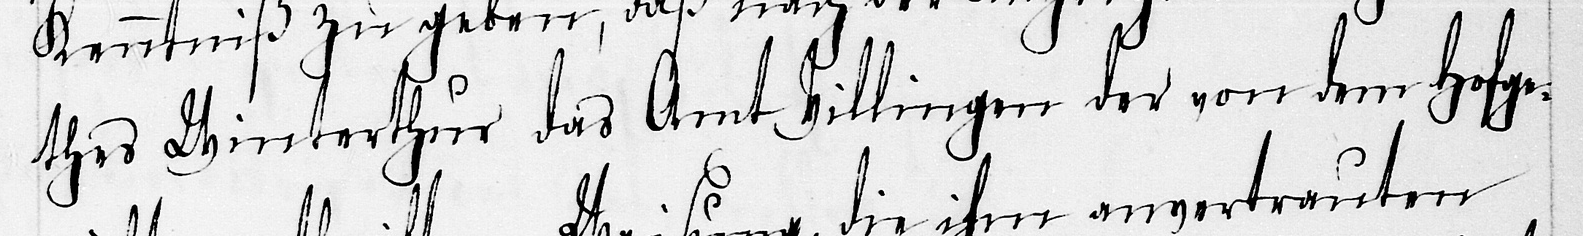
thes Winterthur das Amt Villingen der von dem Hofge¬
